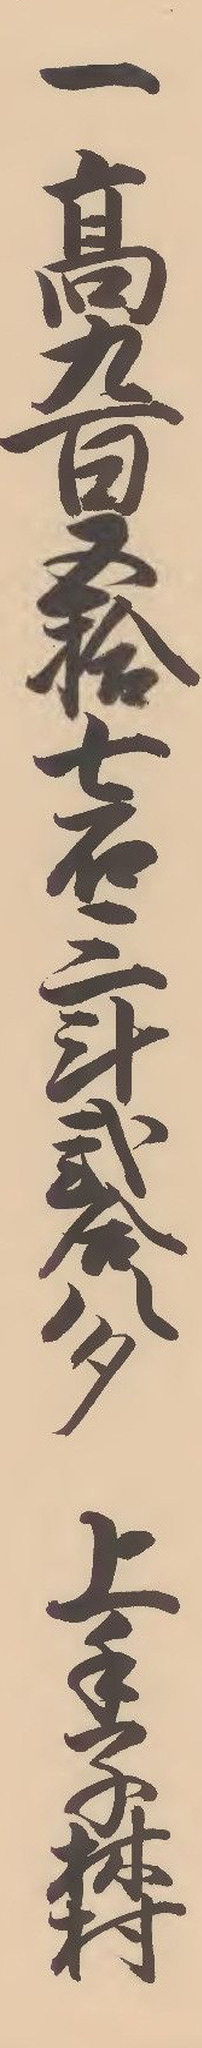一高九百五拾七石三斗弐合八勺上手林村

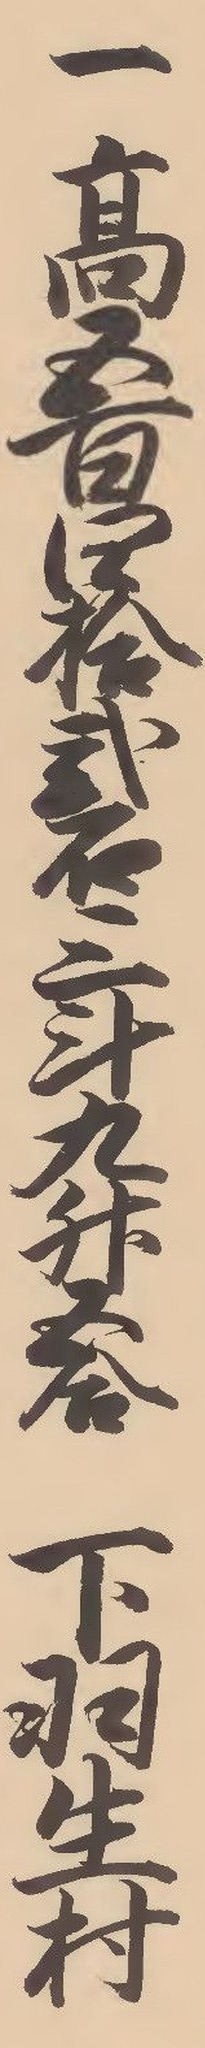一高五百四拾弐石三斗九升五合下羽生村
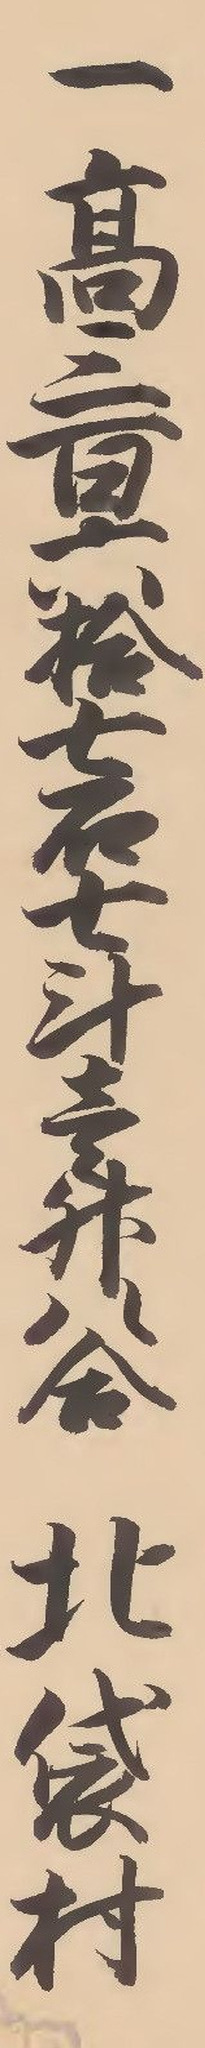一高三百六拾七石七斗壱升八合北袋村
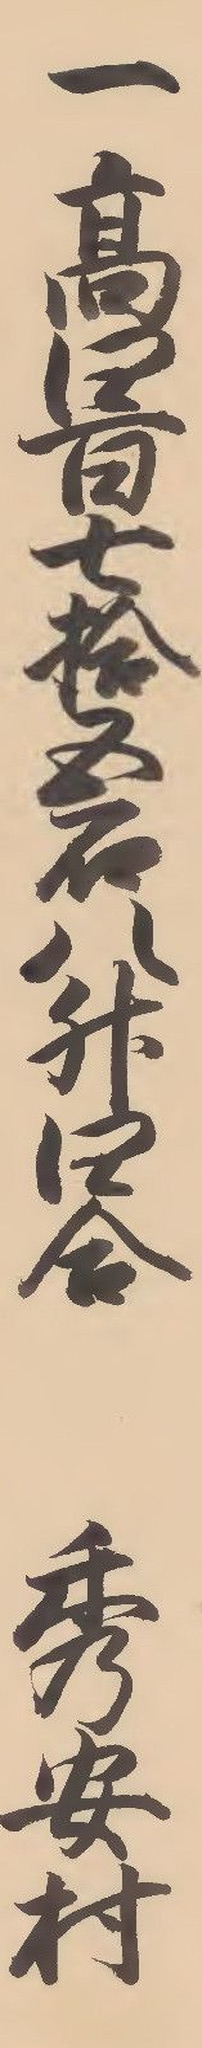一高四百七拾五石八升四合秀安村
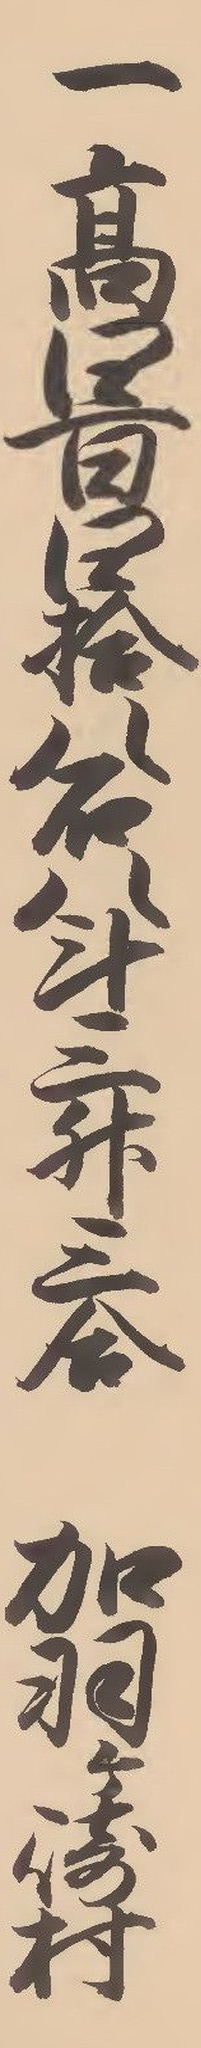一高四百四拾八石八斗三升三合加羽ヶ崎村
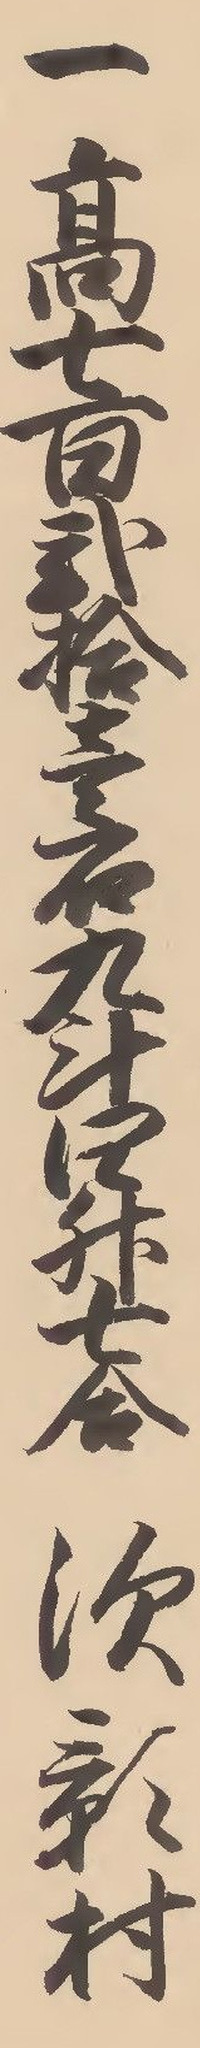一高七百弐拾壱石九斗四升七合須影村
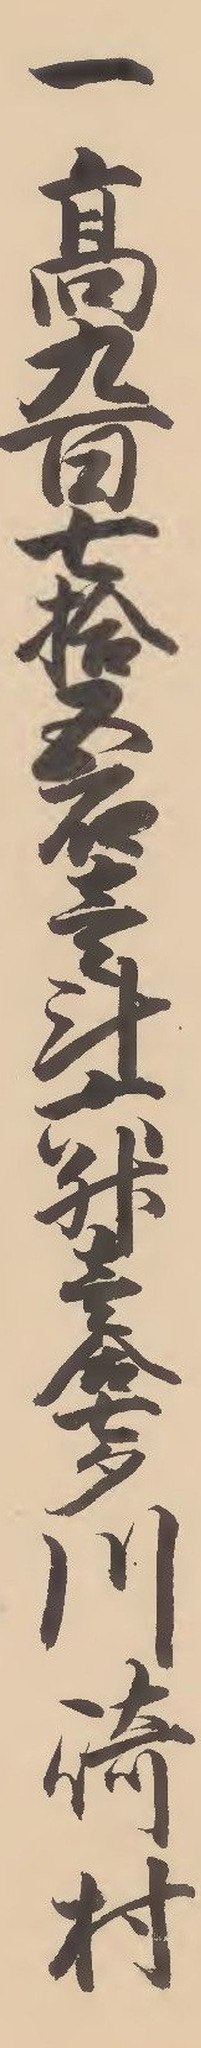一高九百七拾五石壱斗六升壱合七勺川崎村
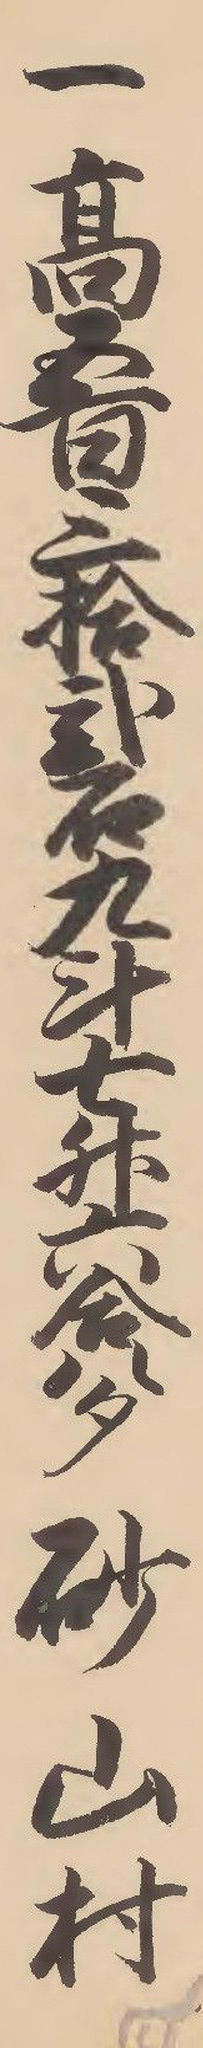一高五百三拾弐石九斗七升六合八勺砂山村
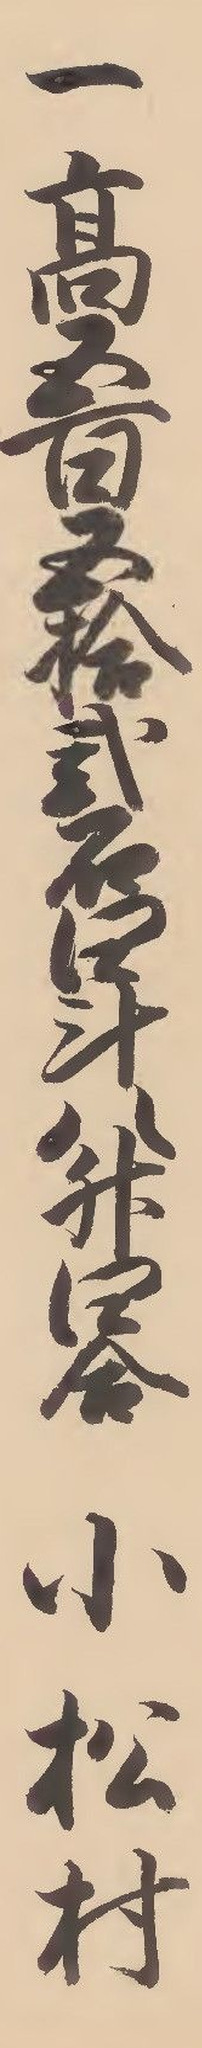一高五百五拾弐石四斗八升四合小松村

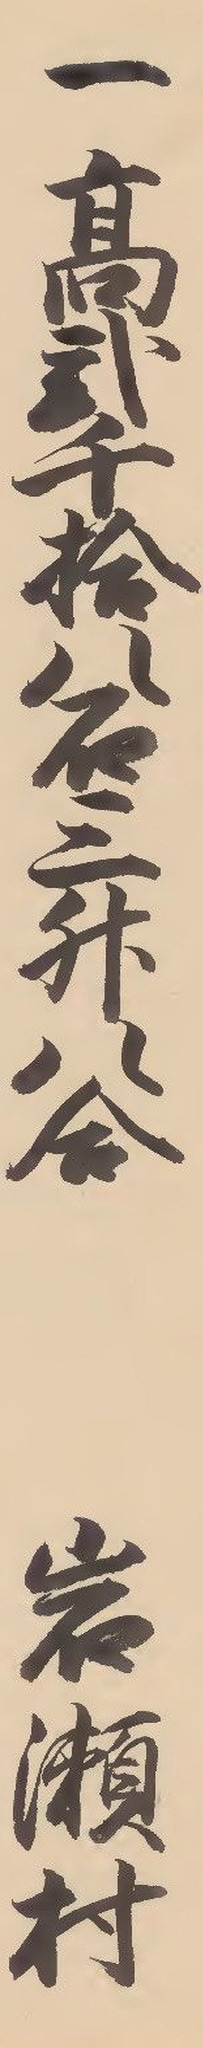一高弐千拾八石三升八合岩瀬村
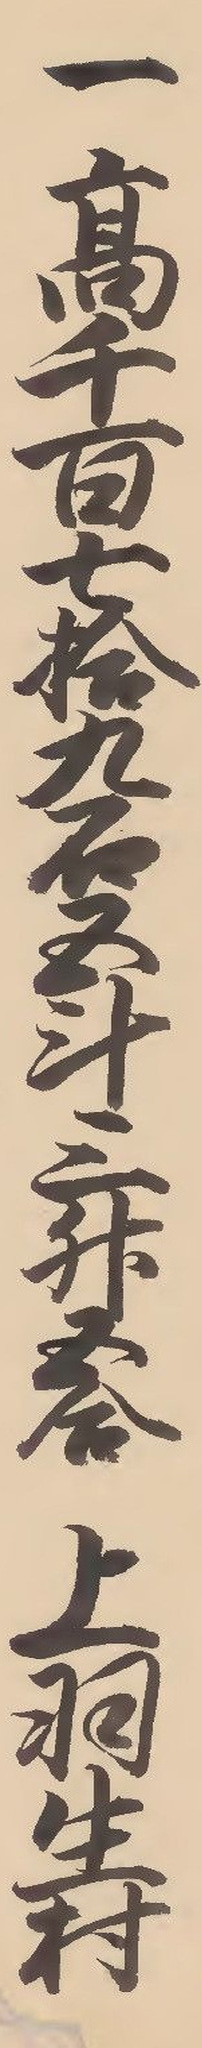一高千百七拾九石五斗三升五合上羽生村
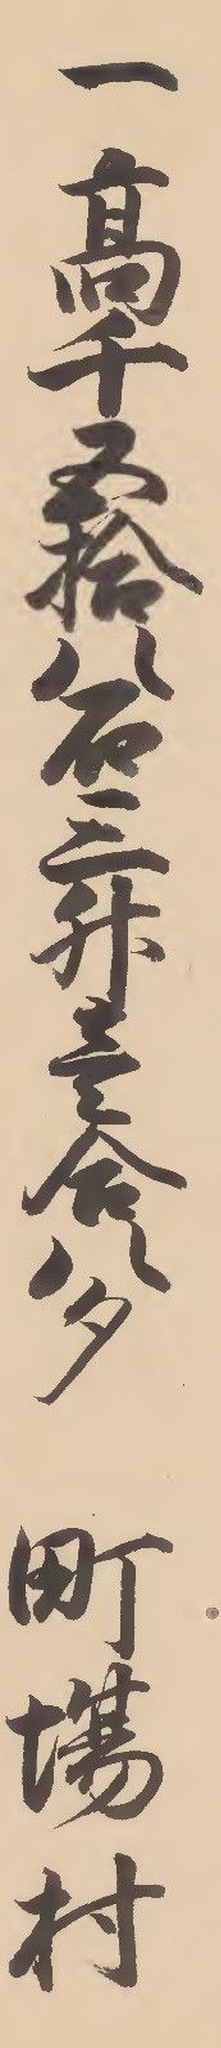一高千五拾八石三升壱合八勺町場村
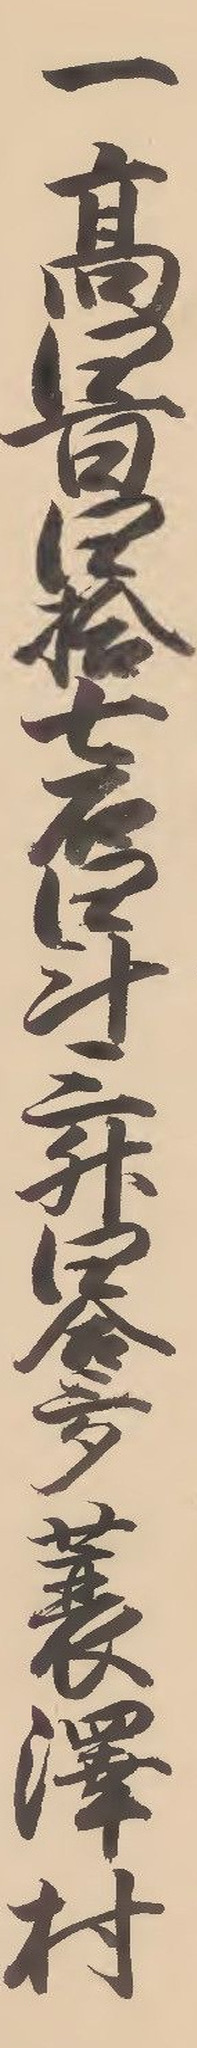一高四百四拾七石四斗三升四合三勺簑澤村
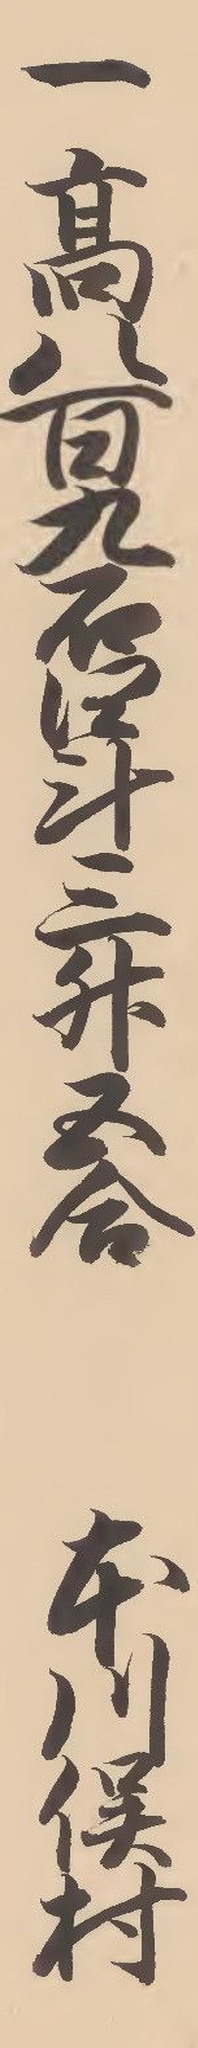一高八百九石四斗三升五合本川保村
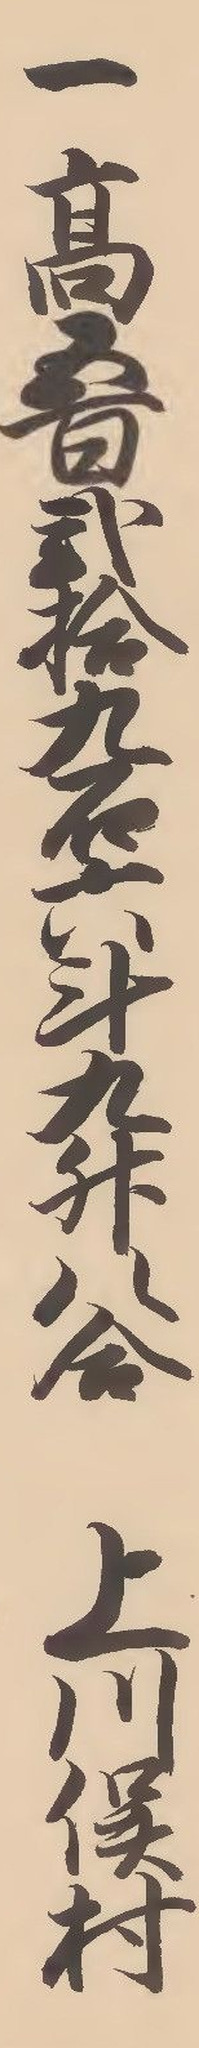一高五百弐拾九石六斗九升八合上川保村
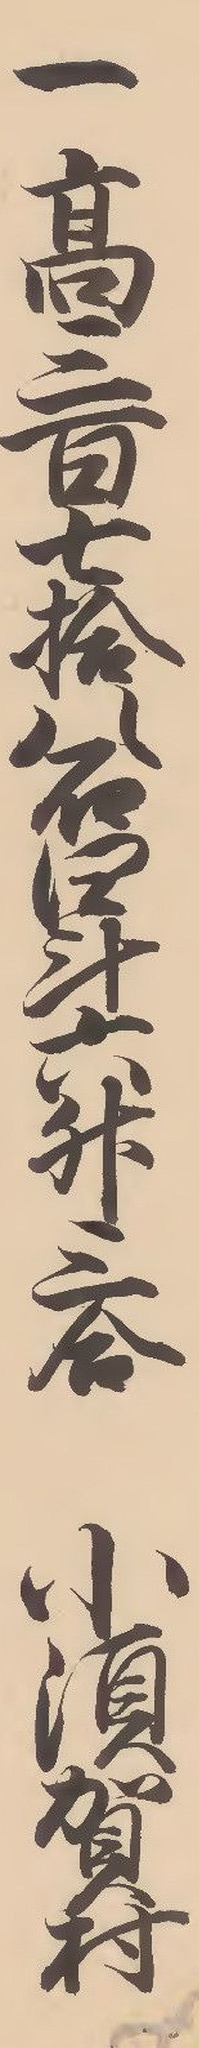一高三百七拾八石四斗六升三合小須賀村
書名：武蔵国郷帳　下
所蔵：国立公文書館 National Archives of Japan
